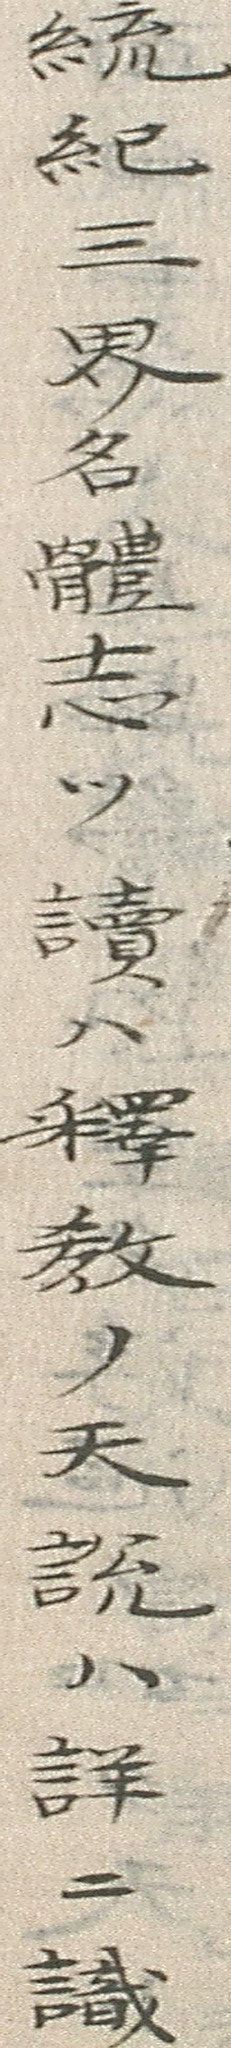統紀三界名体志ッ読ハ釈教ノ天説ハ詳ニ識
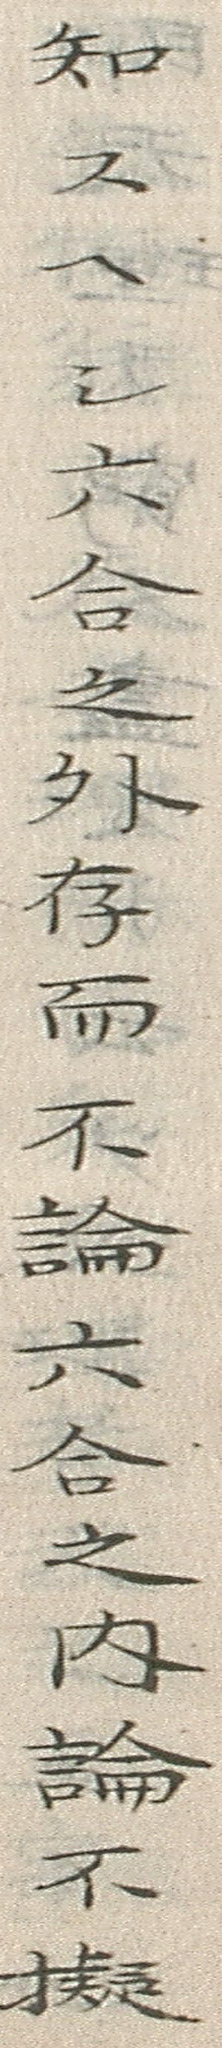知スヘシ六合之外存而不論六合之内論不擬
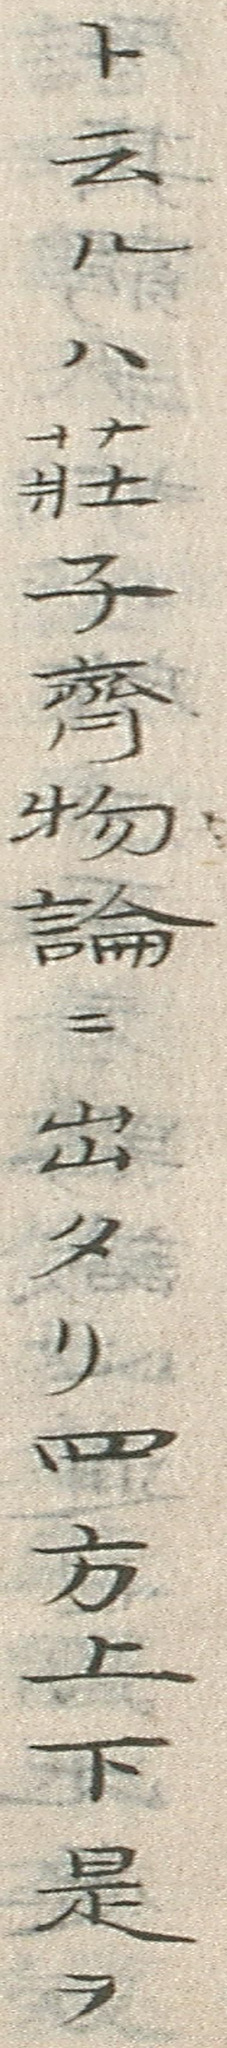ト云ルハ荘子齊物論ニ出タリ四方上下是ヲ
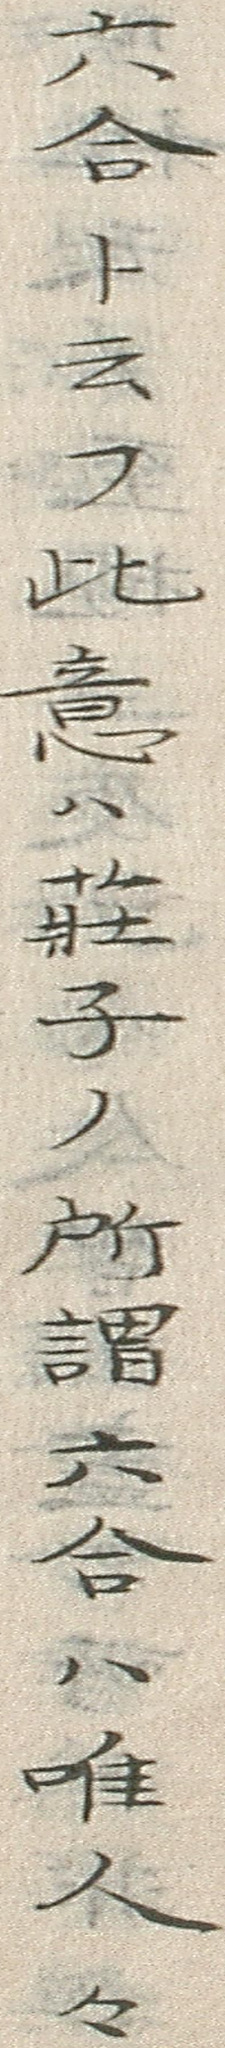六合ト云フ此意ハ荘子ノ所謂六合ハ唯人々
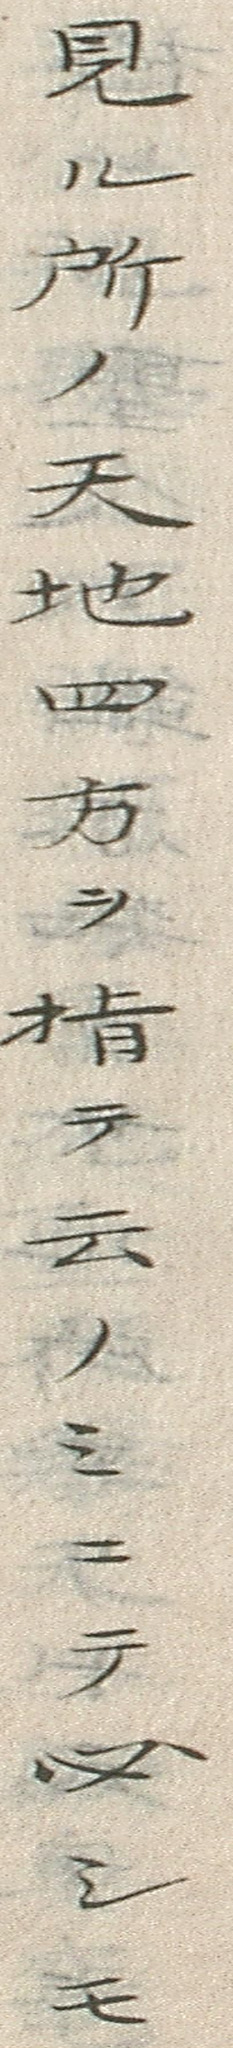見ル所ノ天地四方ヲ指テ云ノミニテ必シモ
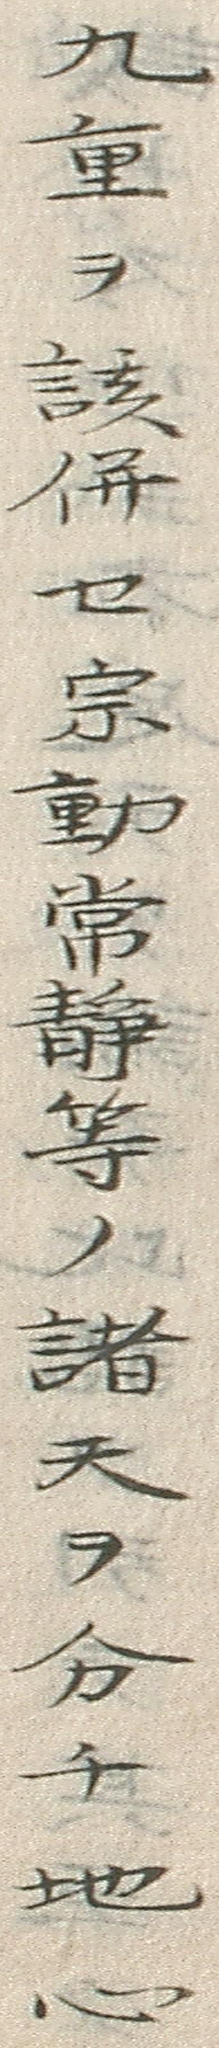九重ヲ該併セ宗動常静等ノ諸天ヲ分チ地心
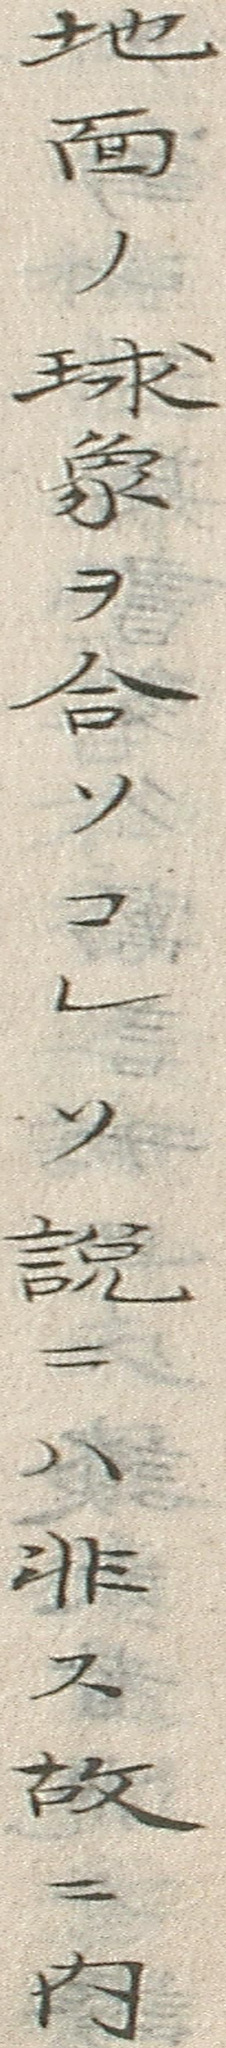地面ノ球象ヲ合ソコレソ説ニハ非ス故ニ内
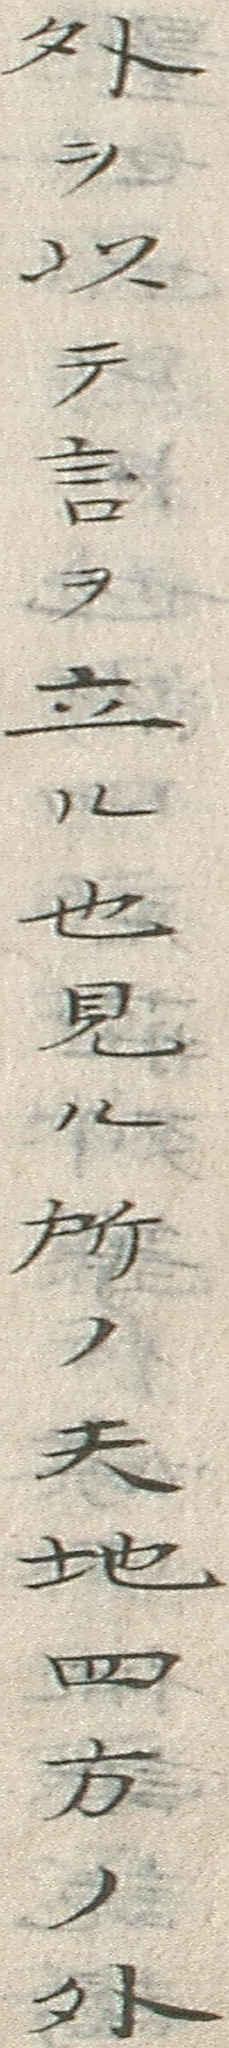外ヲ以テ言ヲ立ル也見ル所ノ天地四方ノ外
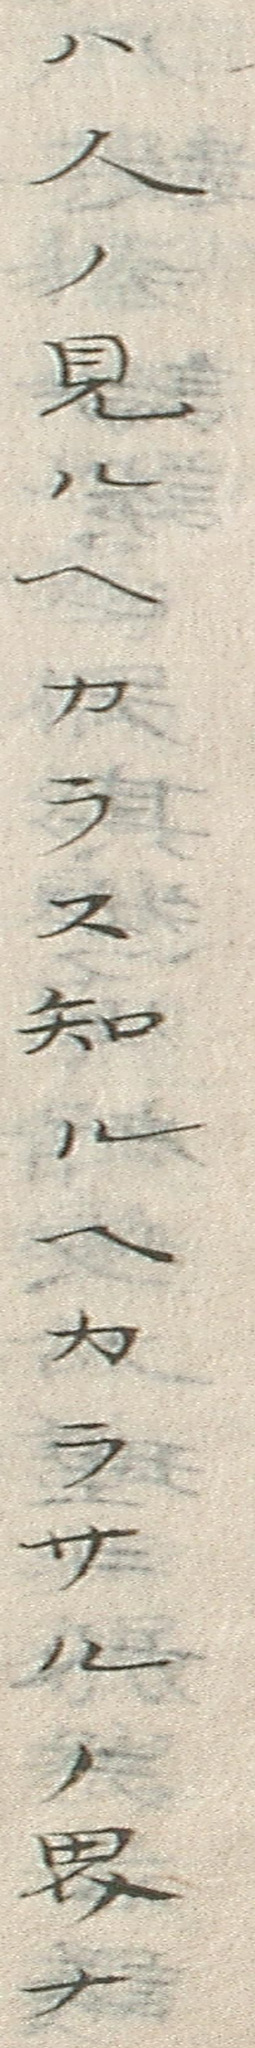ハ人ノ見ルヘカラス知ルヘカラサルノ界ナ
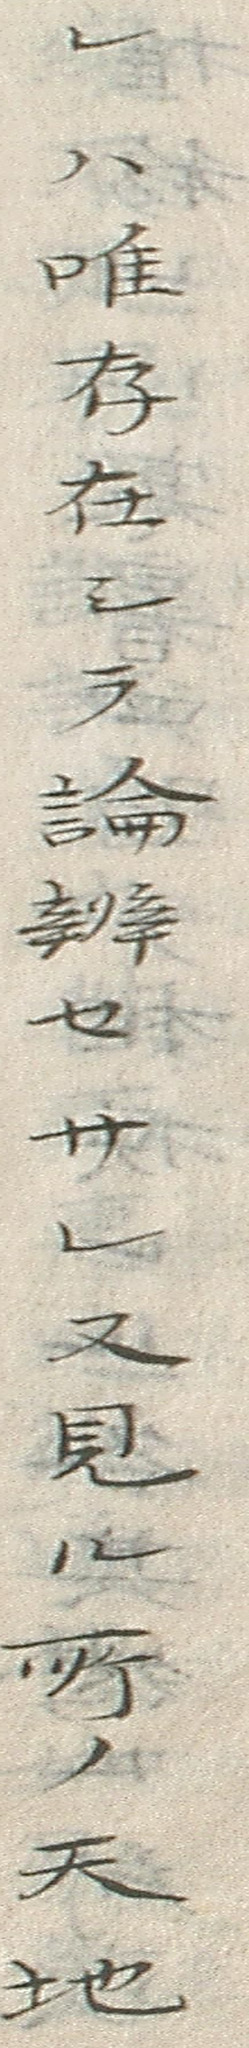レハ唯存在シテ論弁セサレ又見ル所ノ天地
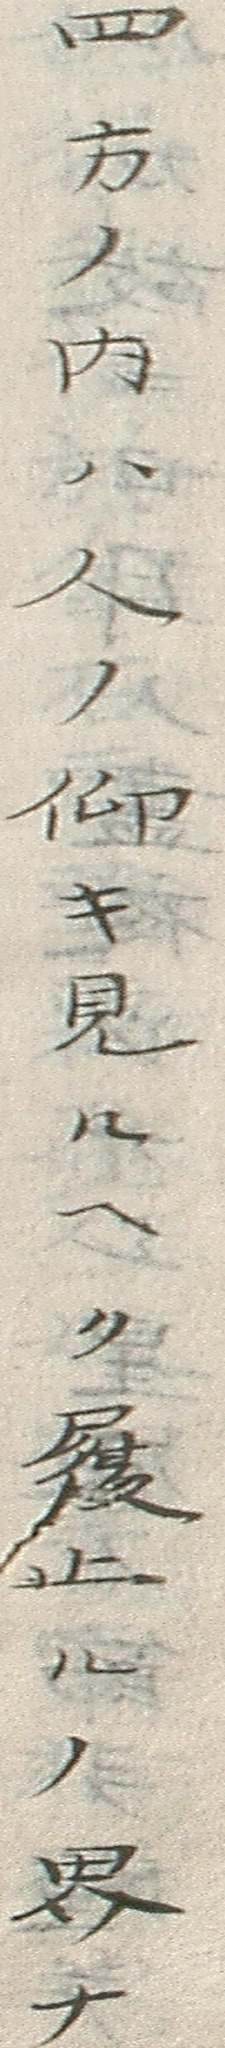四方ノ内ハ人ノ仰キ見ルヘク履止ルノ界ナ

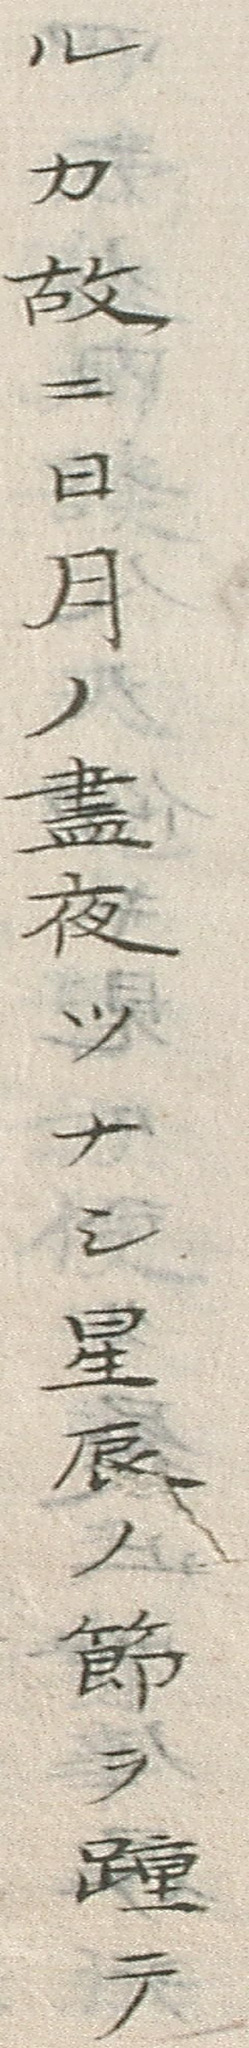ルカ故ニ日月ノ昼夜ッナシ星辰ノ節ヲ踵テ
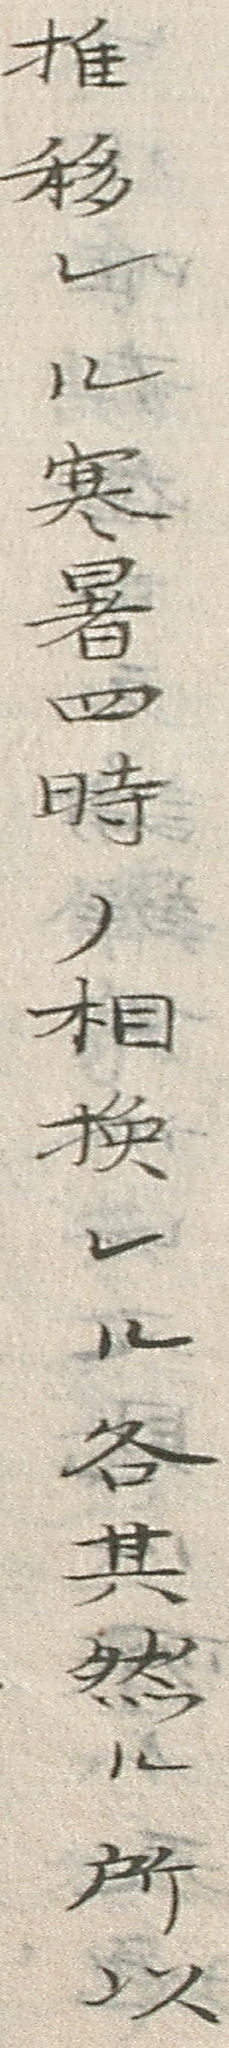推移レル寒暑四時ノ相挽レル各其然ル所以
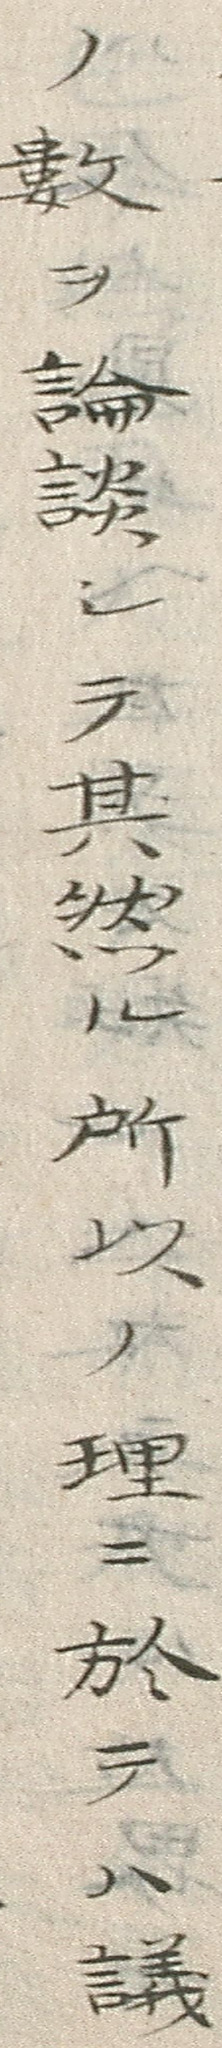ノ数ヲ論談シテ其然ル所以ノ理ニ於テハ議
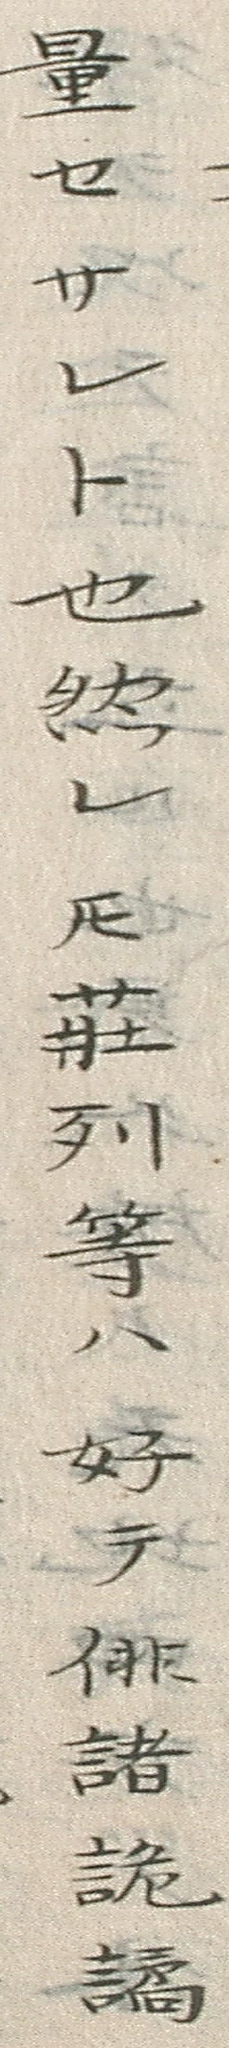量セサレト也然レトモ荘列等ハ好テ俳諸詭譎
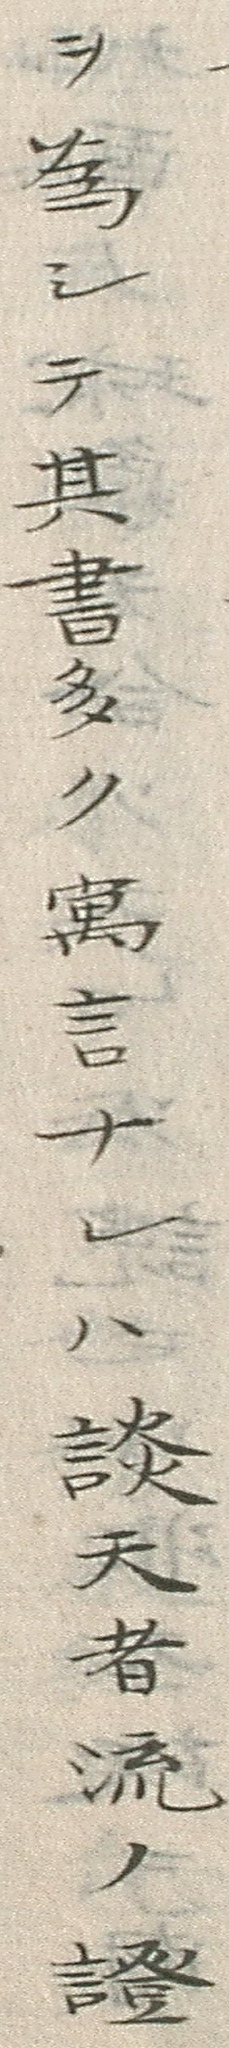ヲ為シテ其書多ク寓言ナレハ談天者流ノ証
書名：天學略名目羽翼　全
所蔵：東京大学地震研究所図書室 Earthquake Research Institute Library, The University of Tokyo, JAPAN
